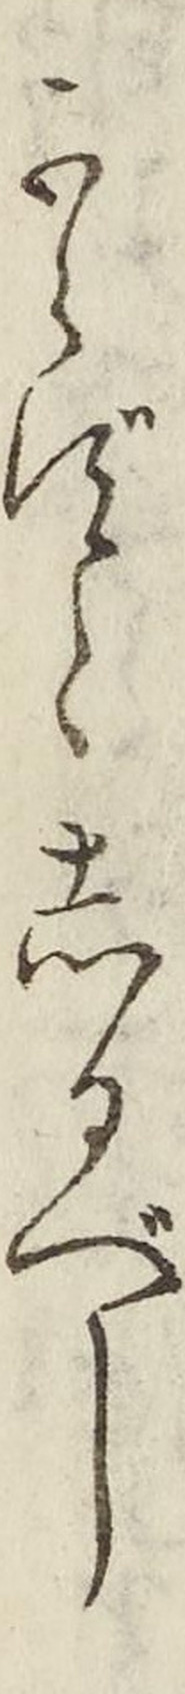からずとしるべし
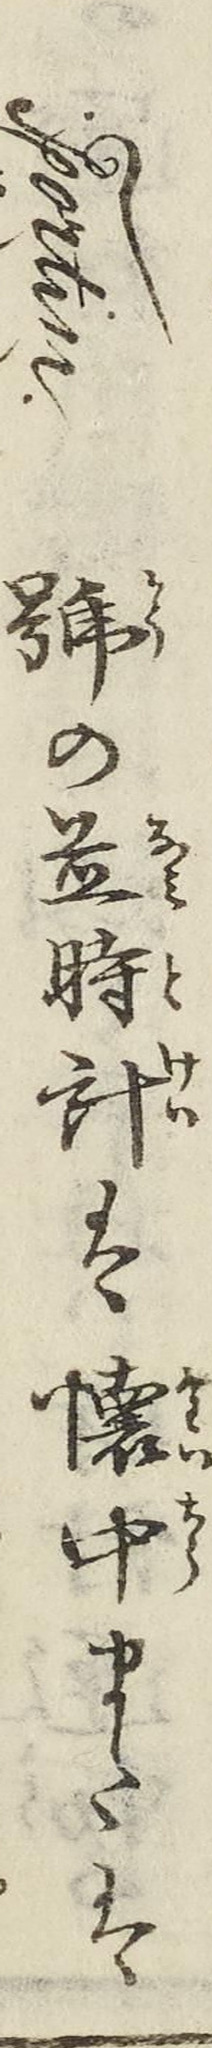号の並時計は懐中または
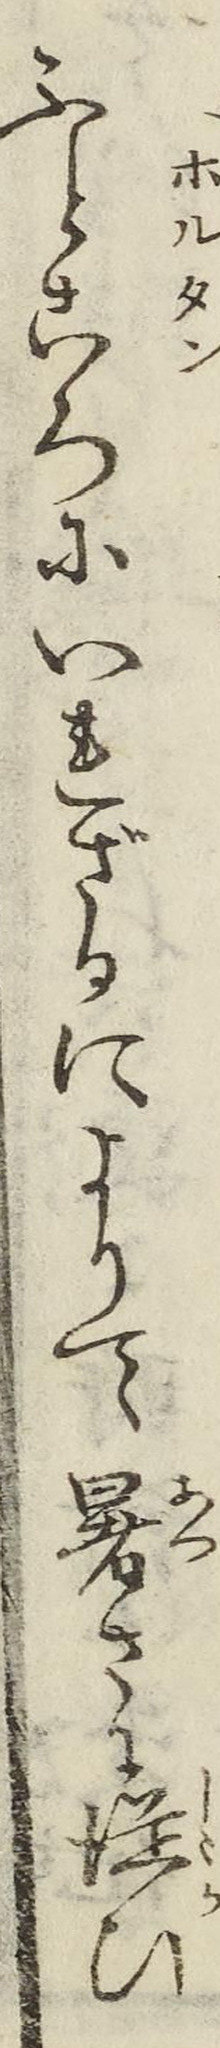ふところにいれざるによりて暑さに従ひ
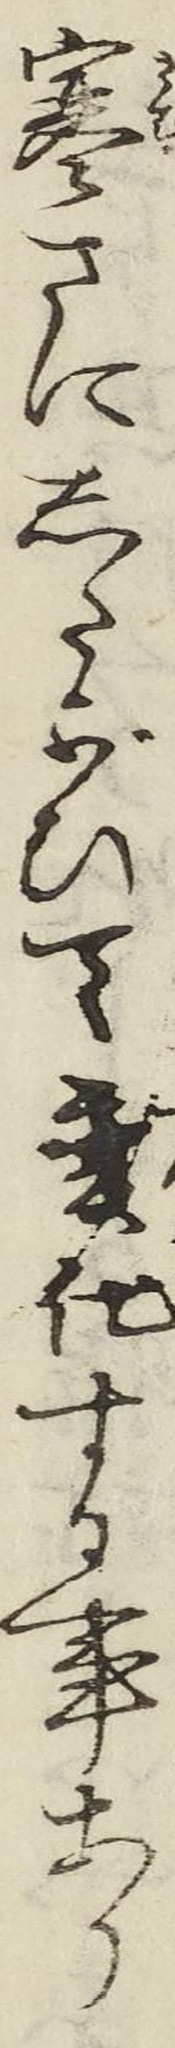寒さにしたがひて変化する事あり
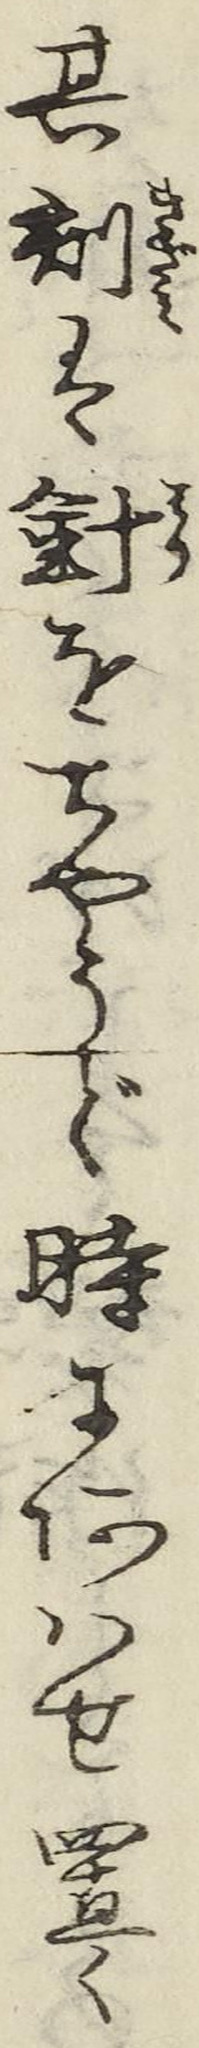其刻は針をちやうど時にあはせ置く
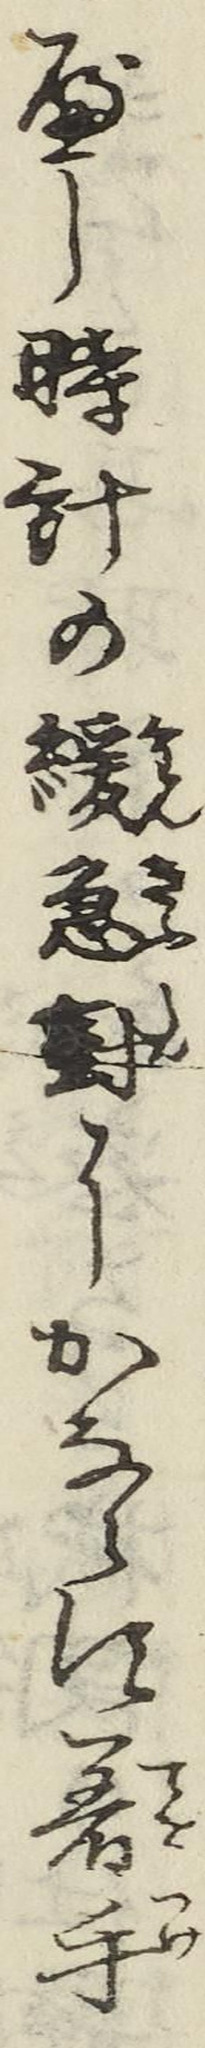べし時計の緩急針にかならす着手
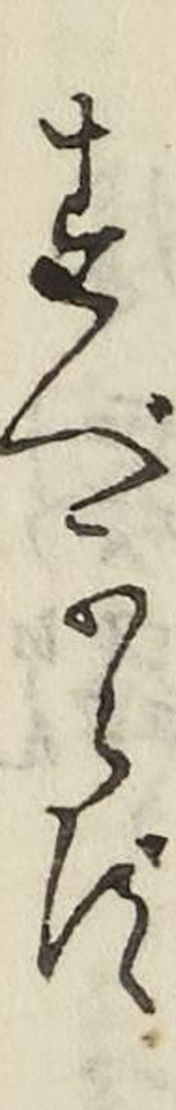すべからず
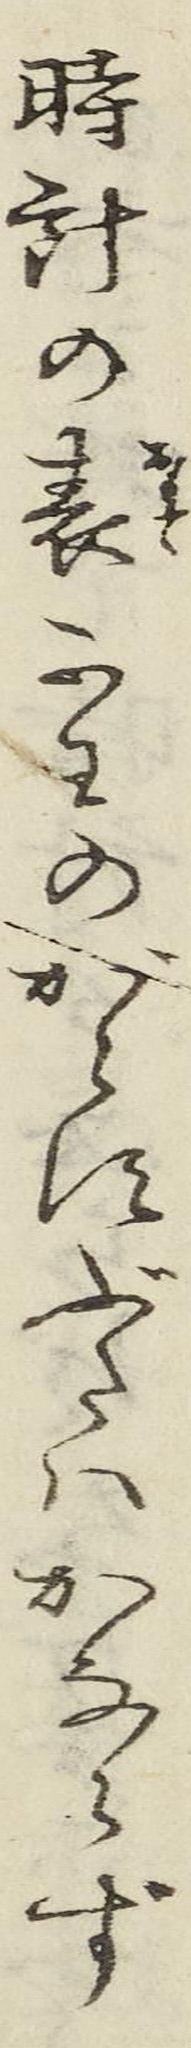時計の表かわのがらすぶたはかならず
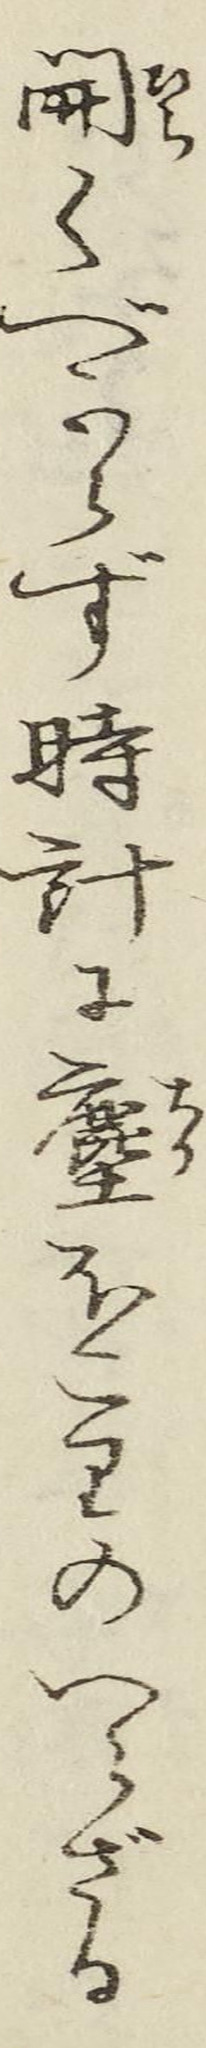開くべからず時計に塵ほこりのいらざる
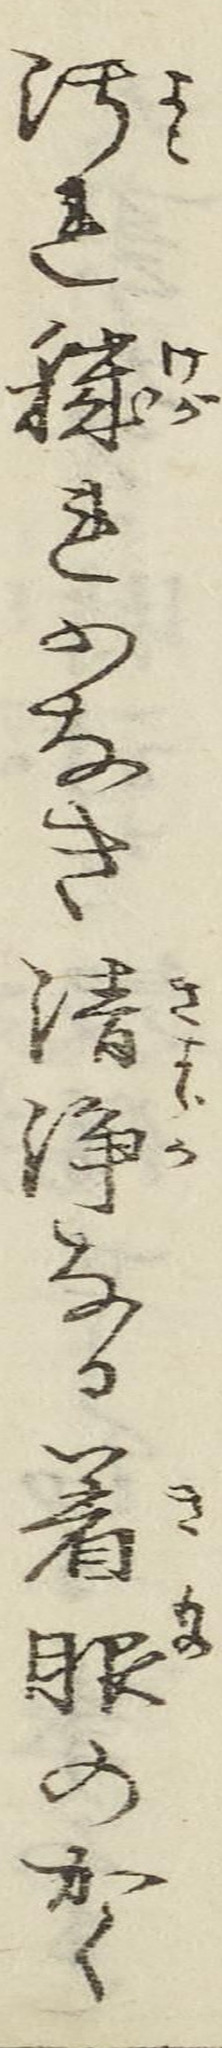汚れ穢れかなき清浄なる着服のかく
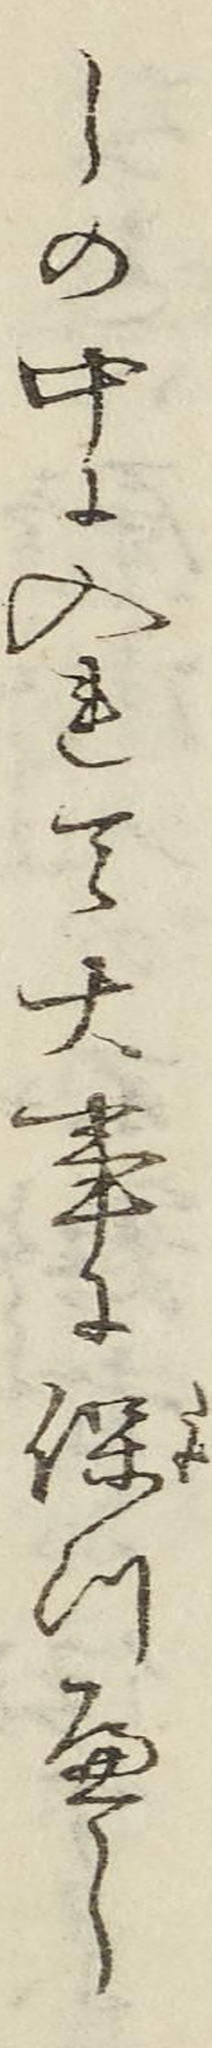しの中に入れて大事に保つへし
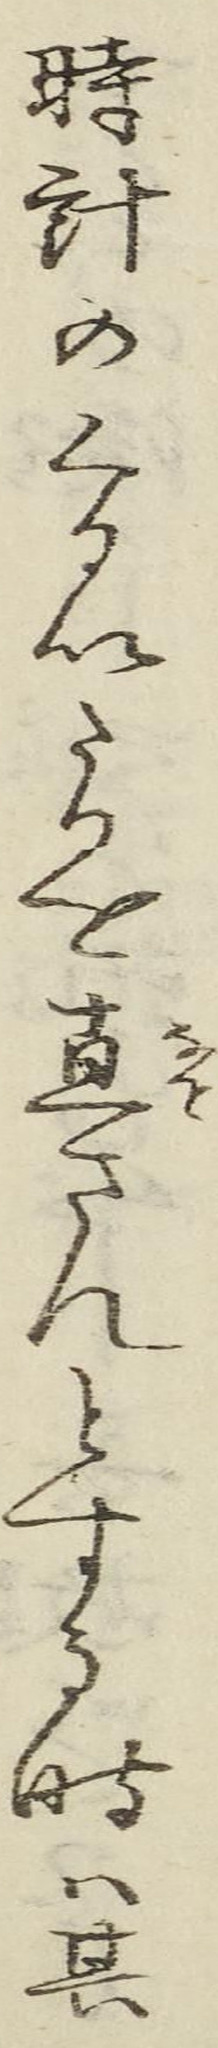時計のくるいたるを直さんとする時は其
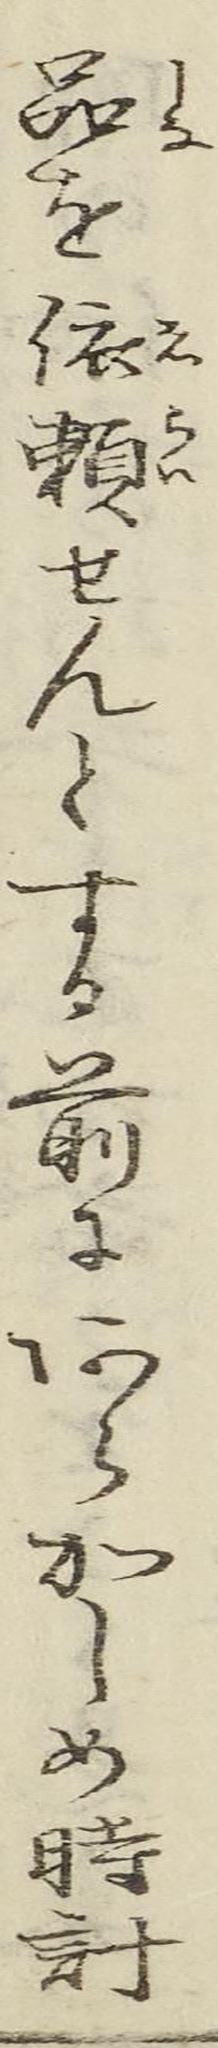品を依頼せんとする前にあらかしめ時計

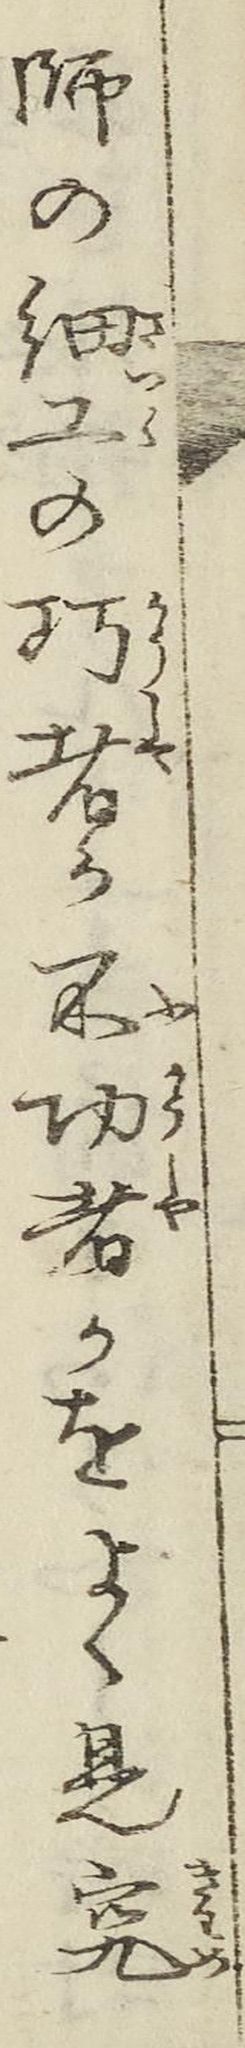師の細工の巧者か不功？者かをよく見究
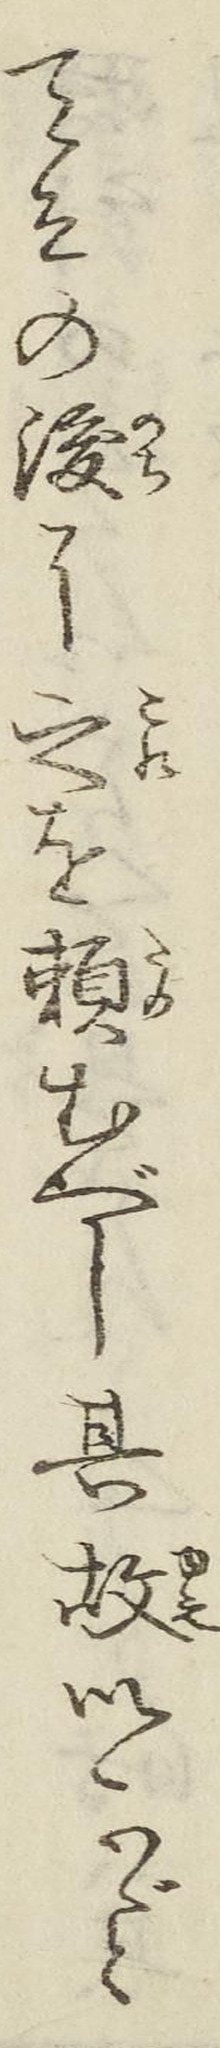てその後に之を頼むべし其故いかゞと
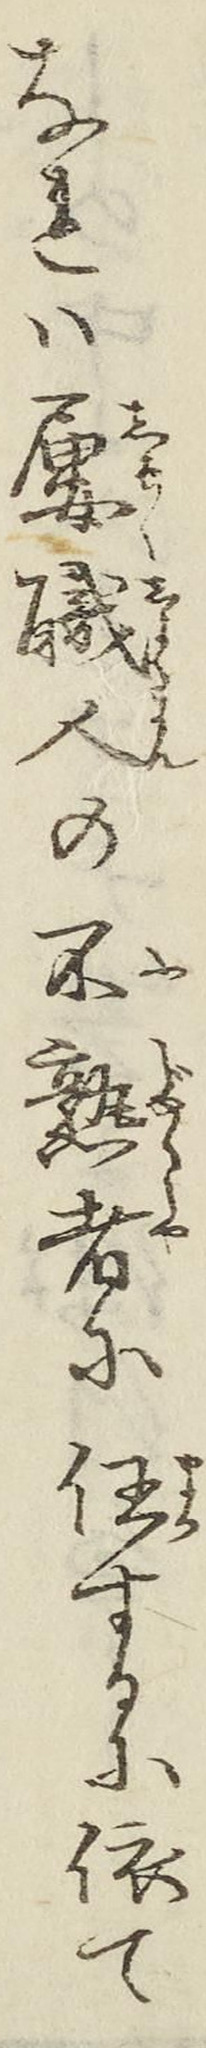なれは屢職人の不熟者に任するに依て
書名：[時計に関する冊子]
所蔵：東京大学地震研究所図書室 Earthquake Research Institute Library, The University of Tokyo, JAPAN
